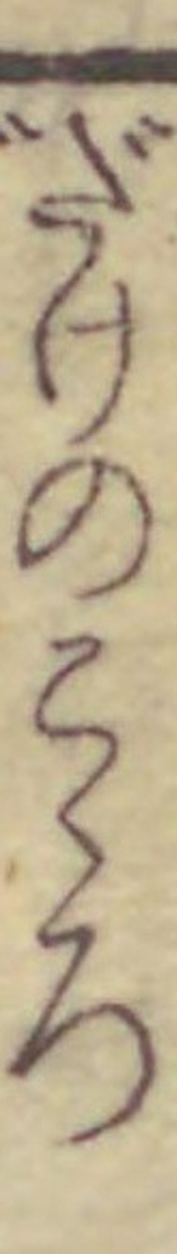だけのこゝろ
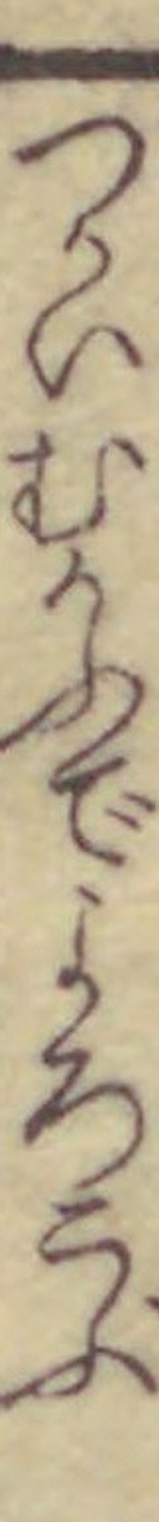づかいむかふでよろこぶ
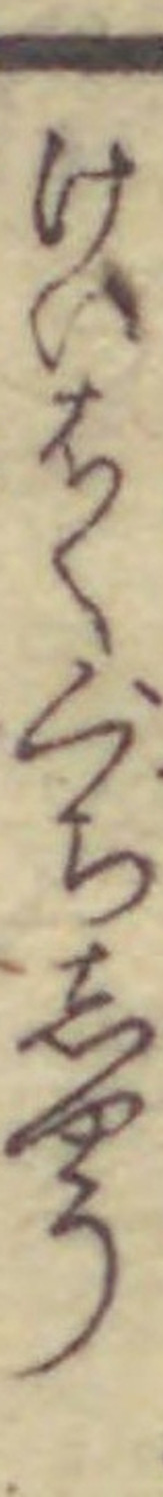けいはくくちしやう
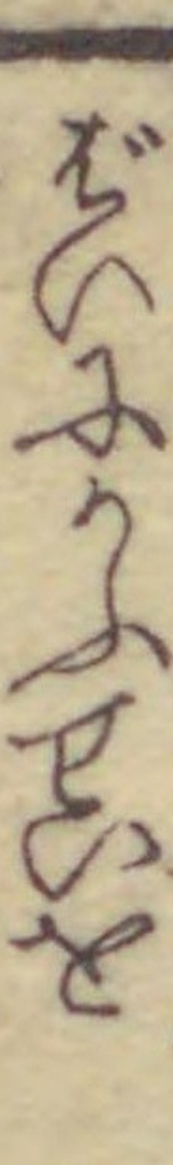ばいにかふせいを
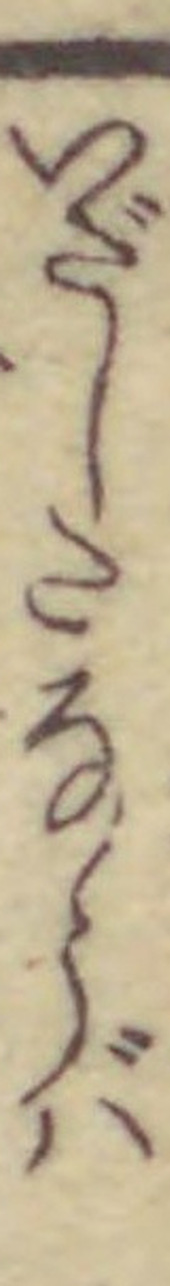いだしたならば
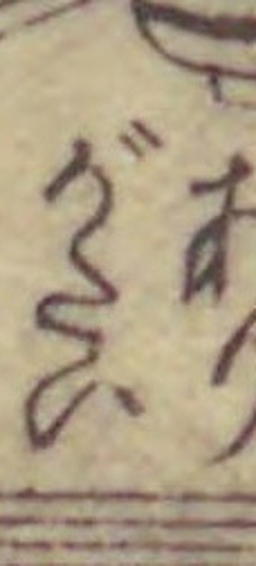がたい
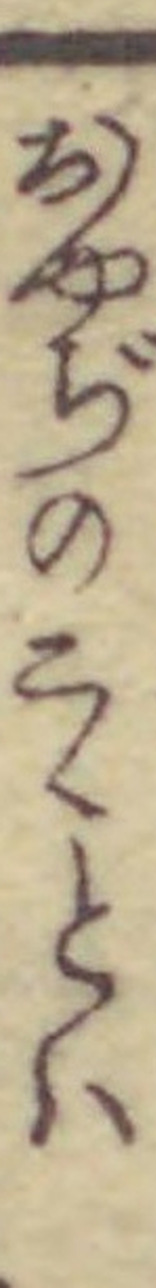おやぢのこゝとは
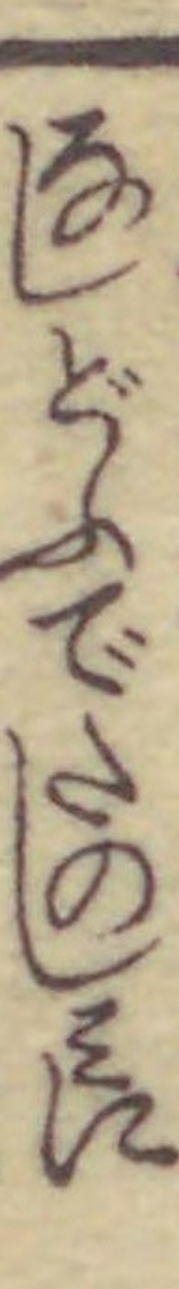なしどふでたのしみに
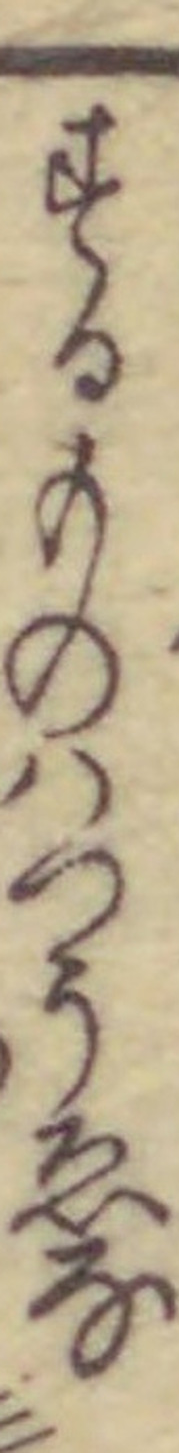するものはつうゑな
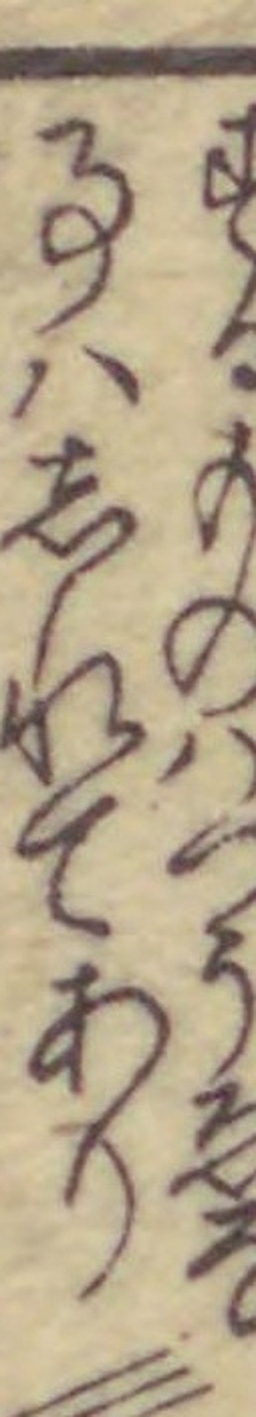事はしれてあり
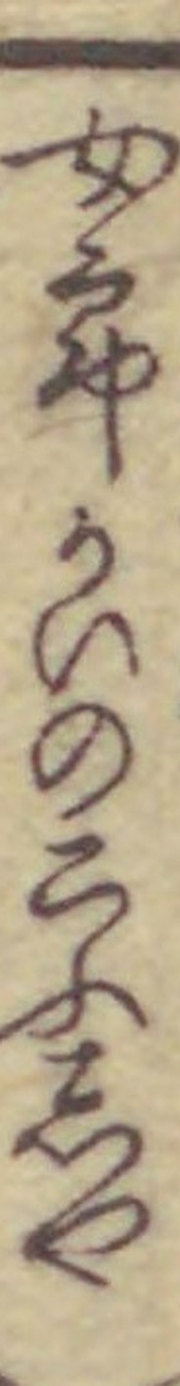女郎かいのこふしや
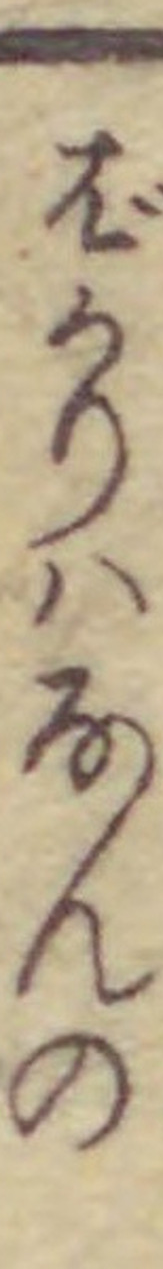ばかりはなんの
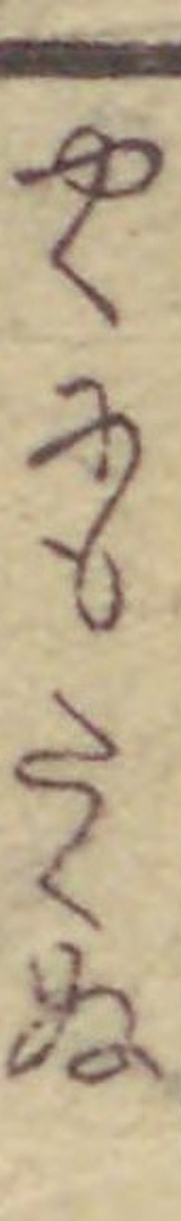やくにもたゝぬ
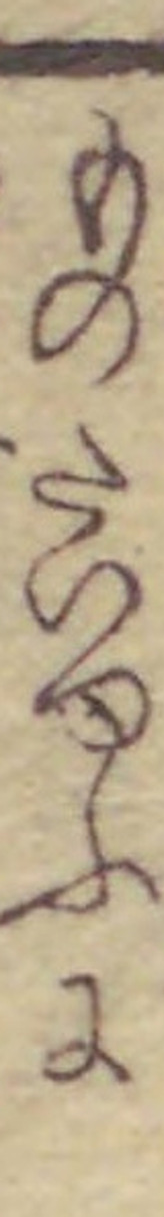ものたいゆふに
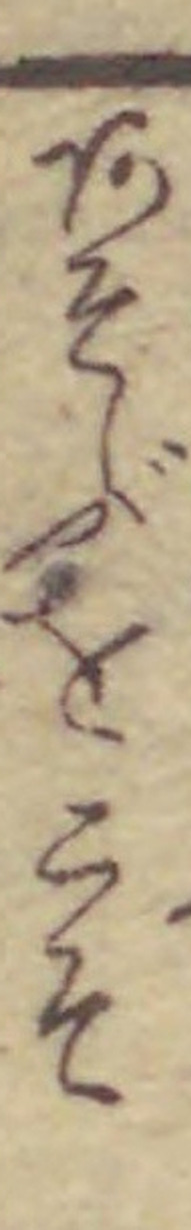あそぶをこそ
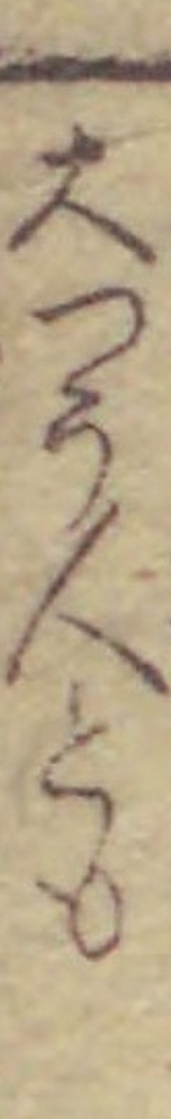大つう人とも
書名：大通人穴[サガシ] 3巻
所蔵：国立国会図書館 National Diet Library, JAPAN
